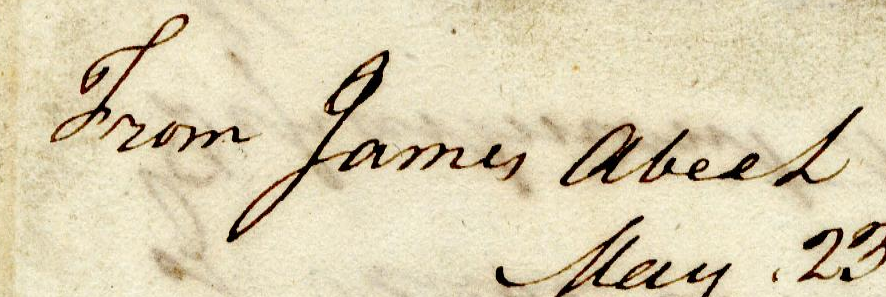From James Abeel
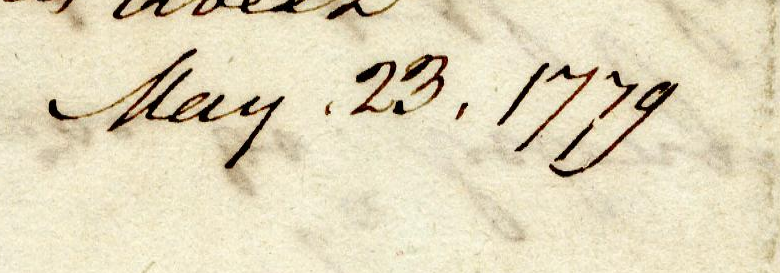May. 23. 1779
